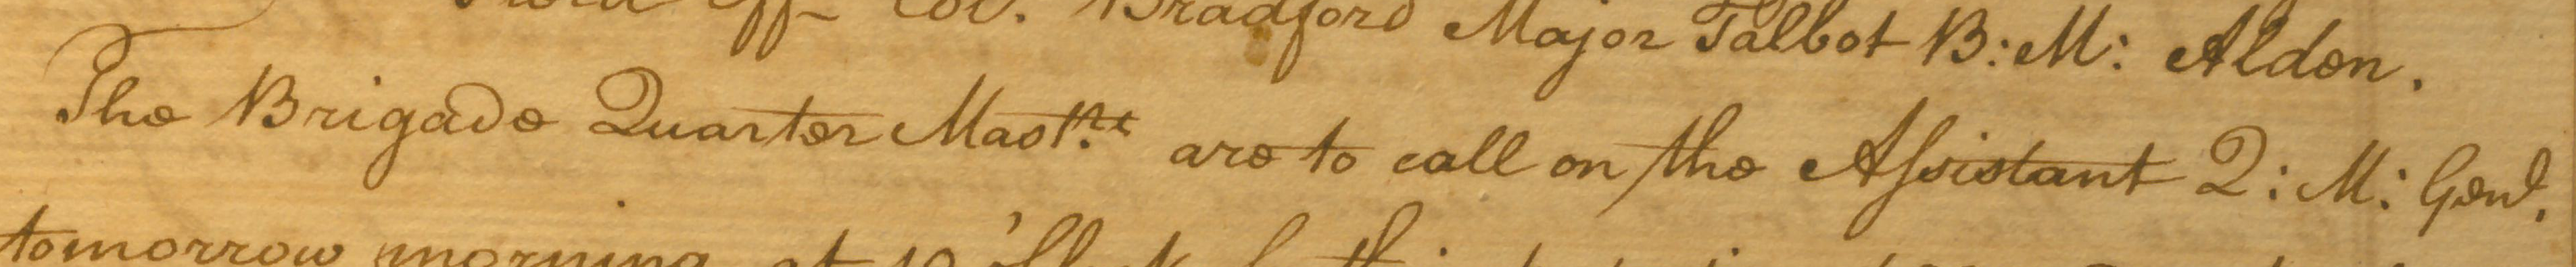The Brigade Quarter Mast^rs. are to call on the Assistant Q: M: Gen^l.
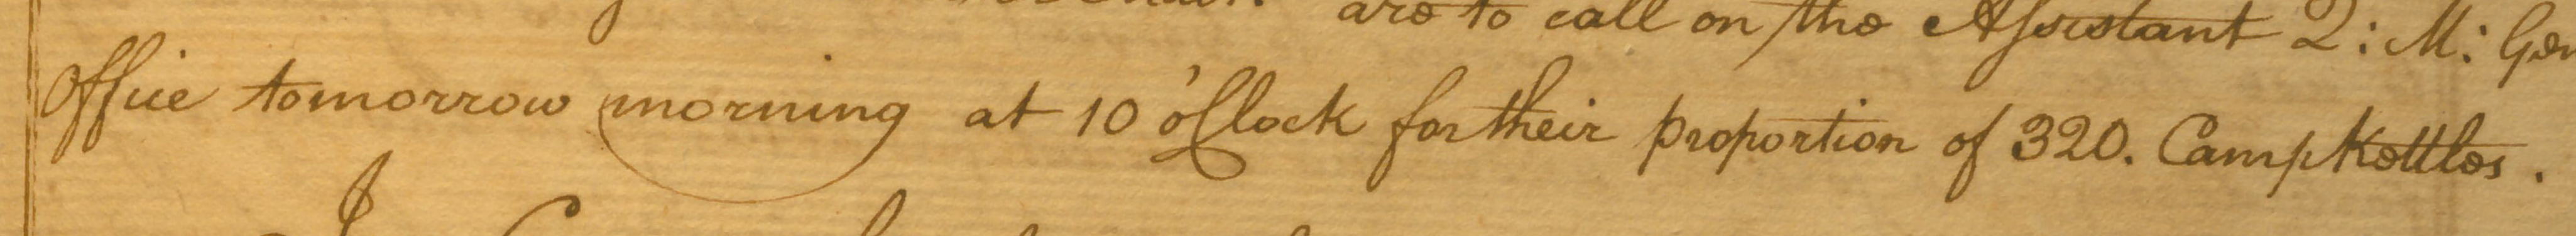Office tomorrow morning at 10 o'Clock for their proportion of 320. Camp Kettles.
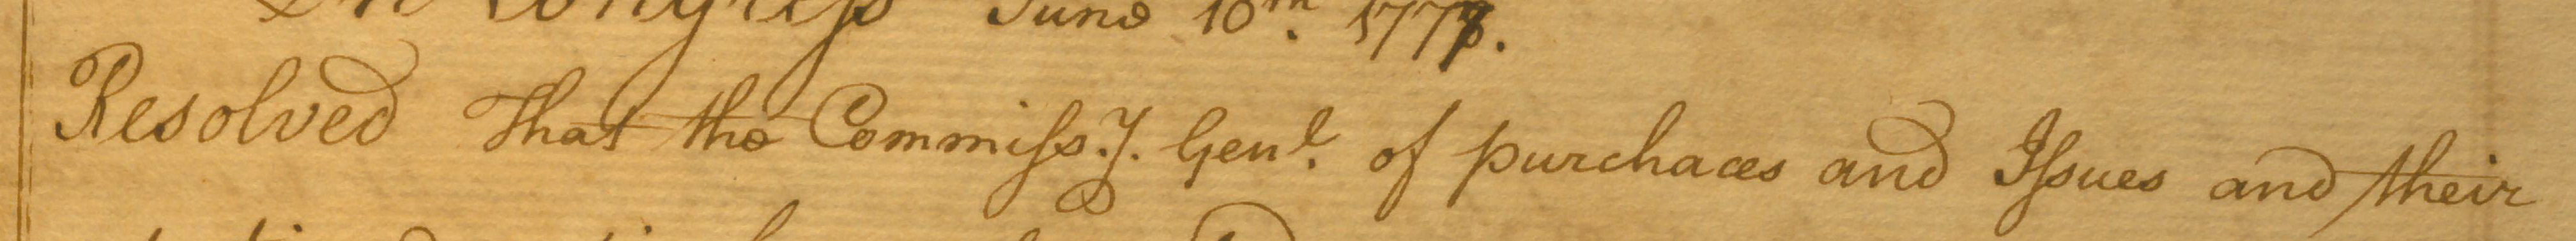Resolved That the Commiss^y. Gen^l. of purchaces and Issues and their
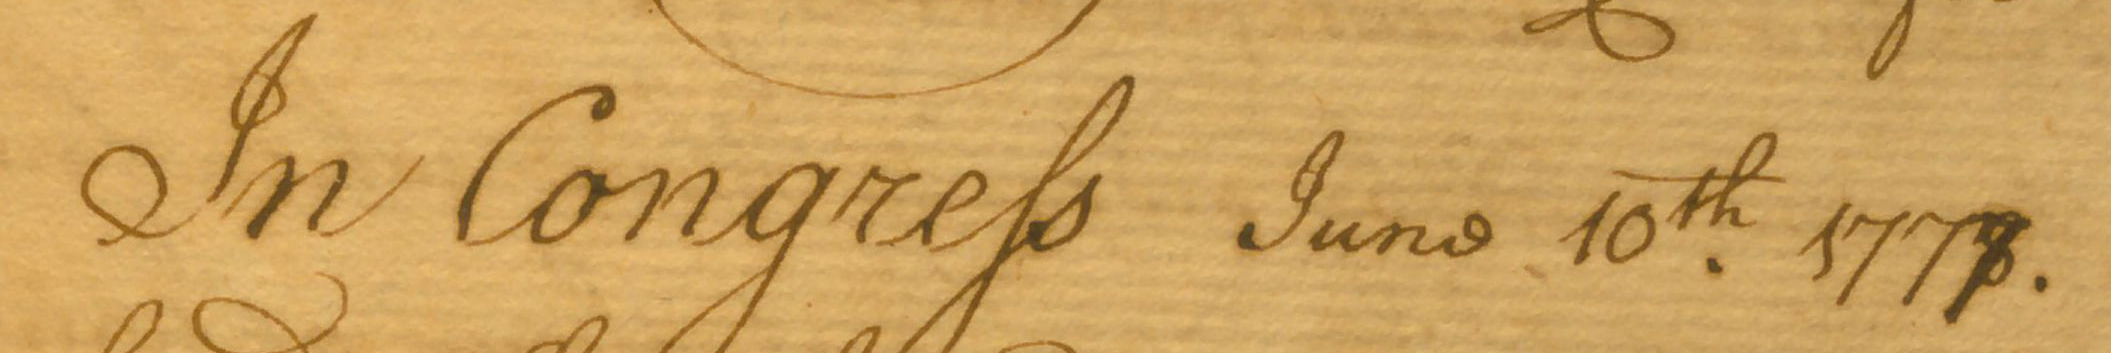In Congress June 10^th. 1777.
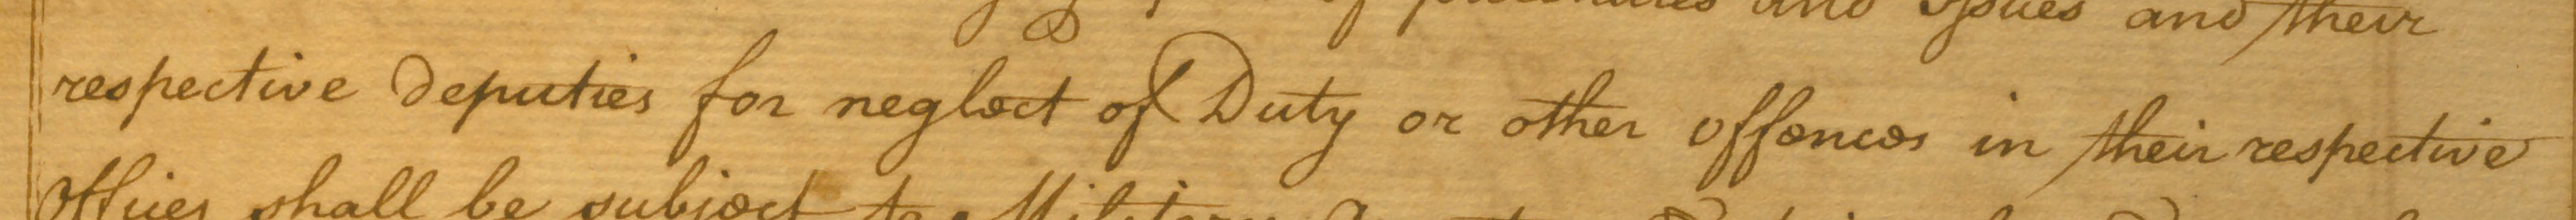respective deputies for neglect of Duty or other offences in their respective
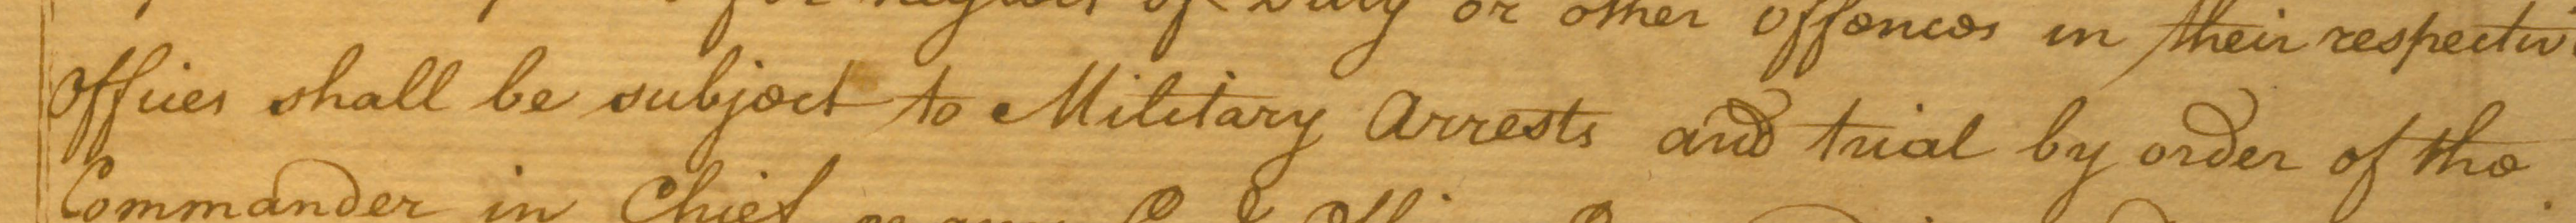Offices shall be subject to Military arrests and trial by order of the
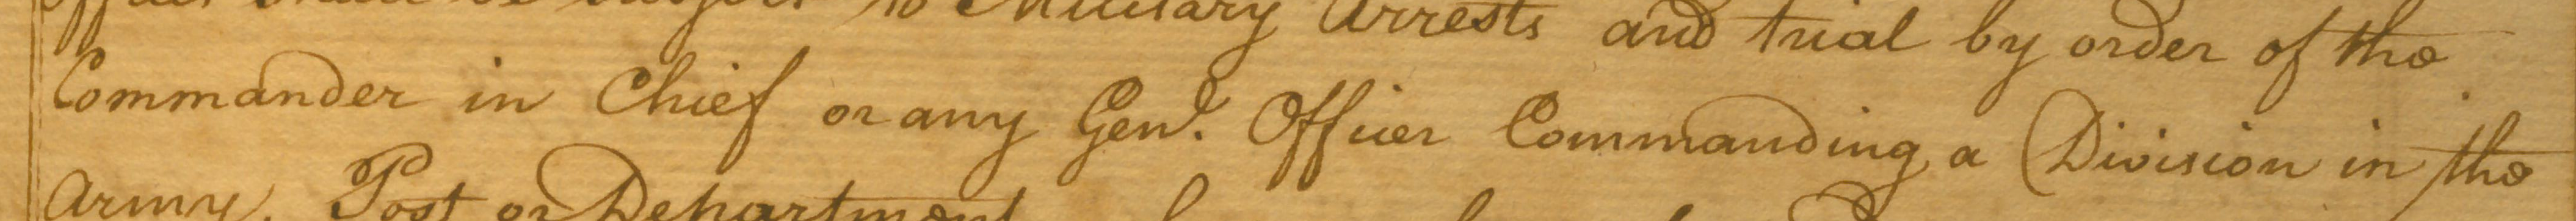Commander in Chief or any Gen^l. Officer Commanding a Division in the
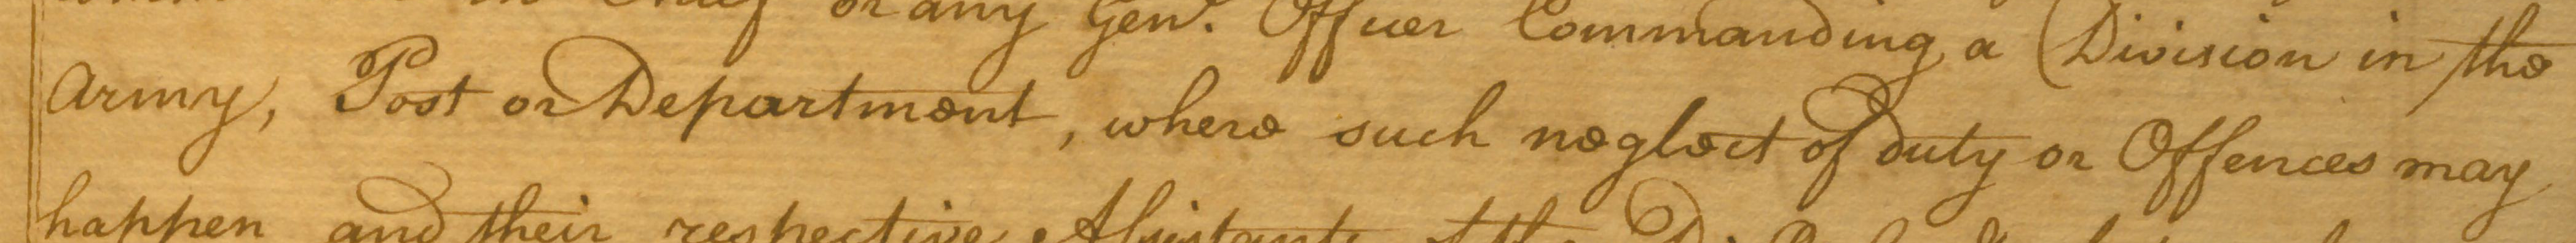Army, Post or Department, where such neglect of duty or Offences may
